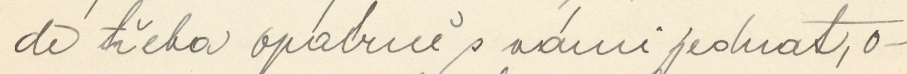de třeba opatrně s vámi jednat, o-
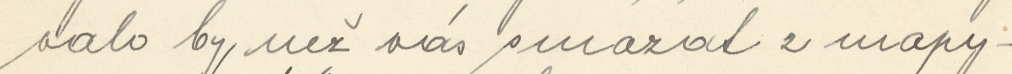valo by než vás smazat z mapy -
